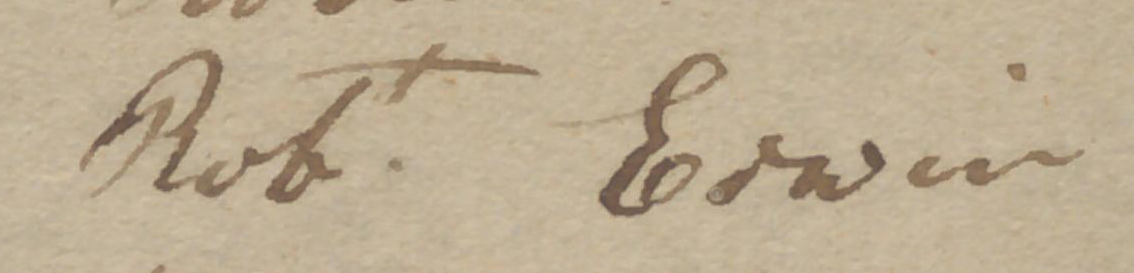Rob^t. Erwin
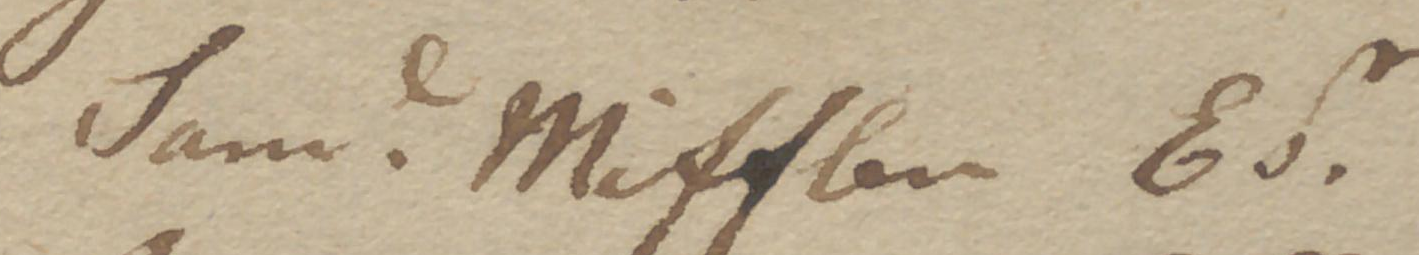Sam^l. Mifflin Es^r.
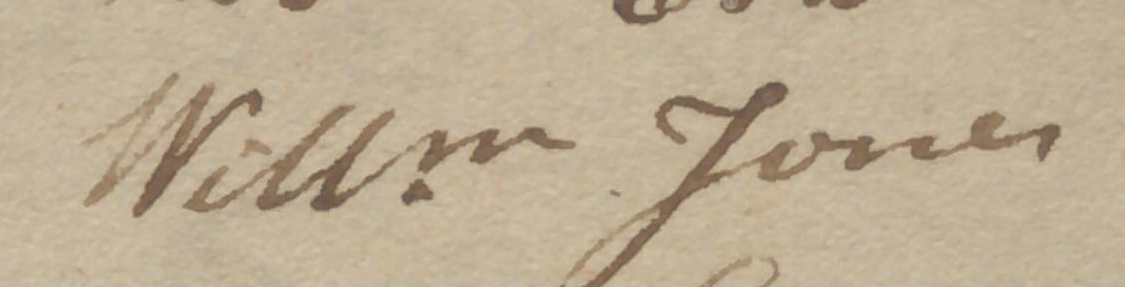Will^m. Jones
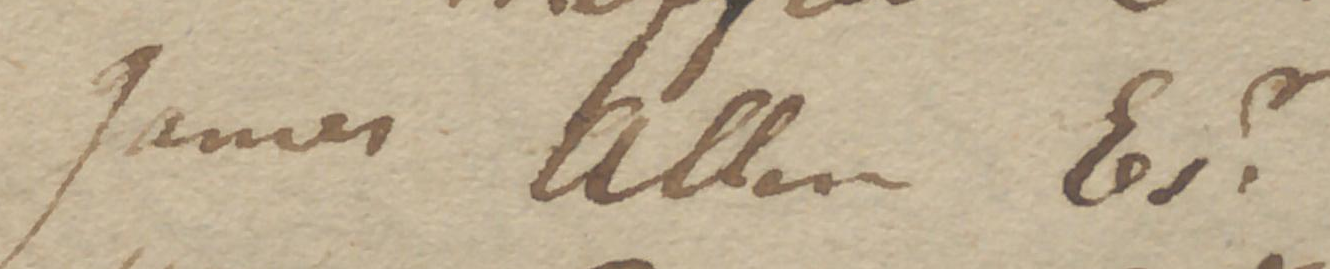James Allen Es^r.
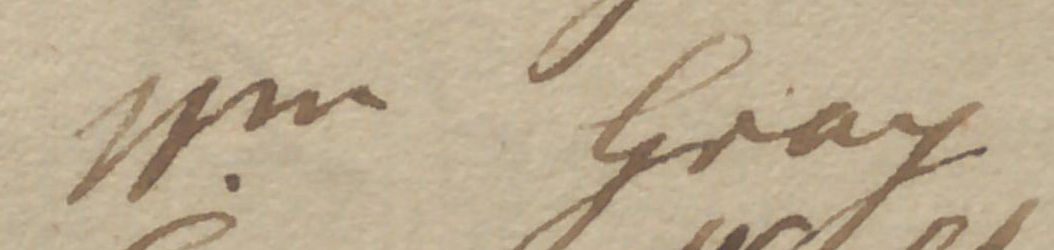W^m. Gray
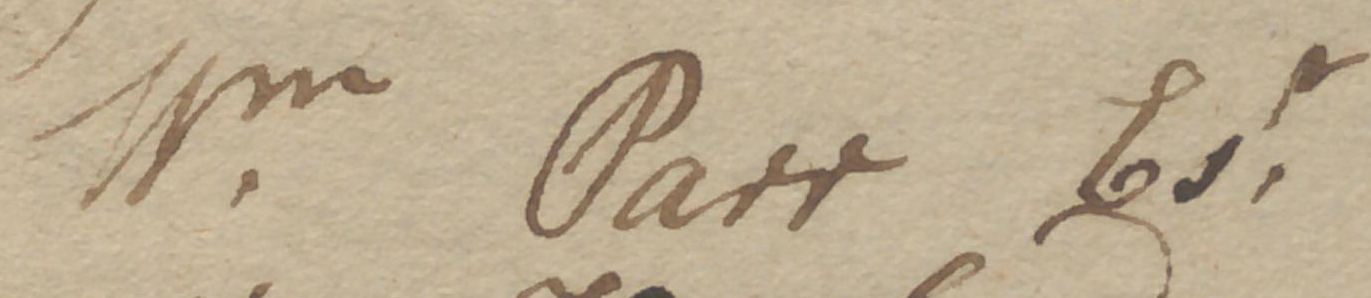W^m. Parr Es^r.
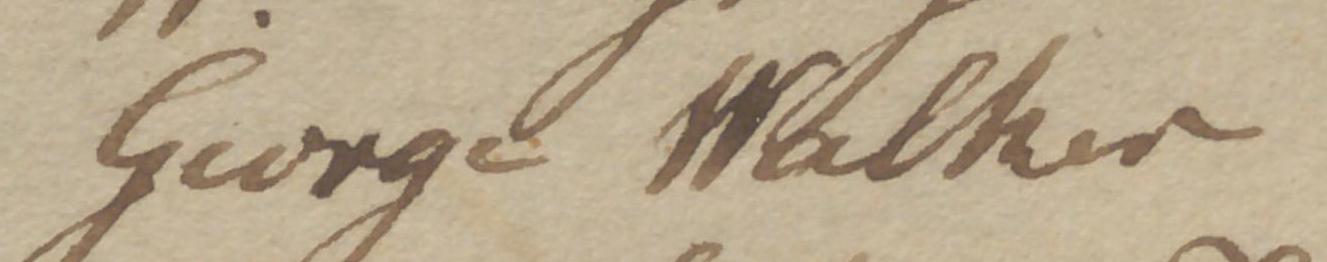George Walker
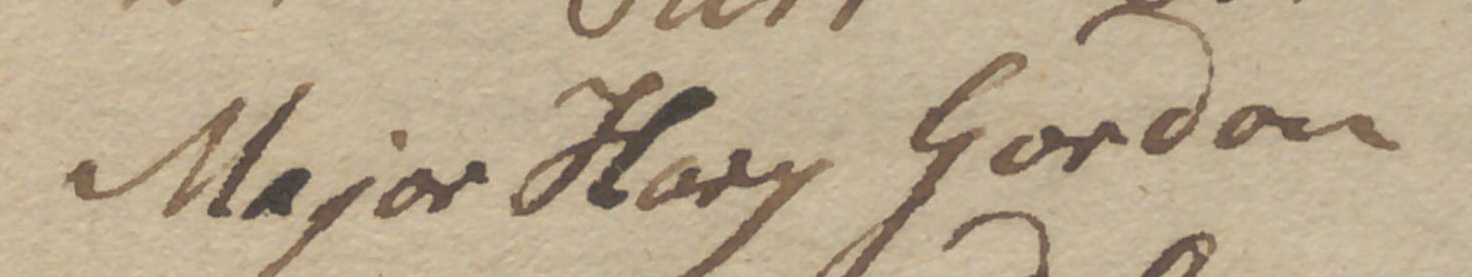Major Hary Gordon
